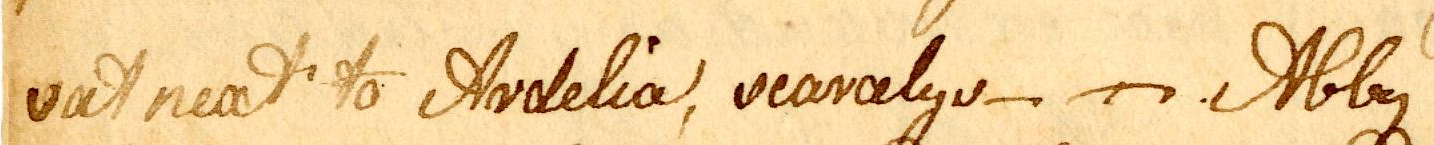sat next to Ardelia, scarcelys- Abby
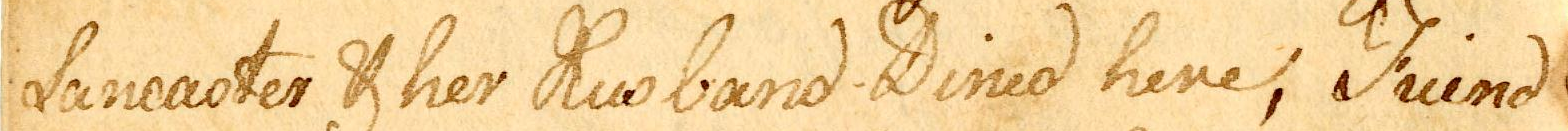Lancaster & her Husband Dined here, Friend
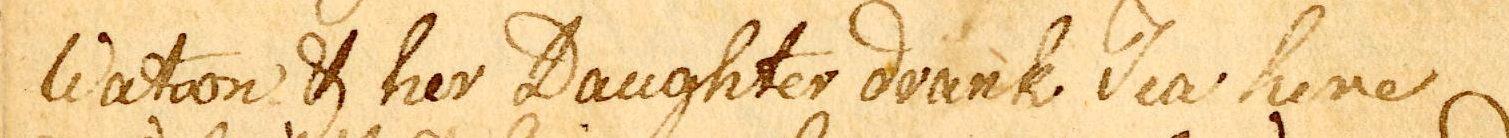Watson & her Daughter drank Tea here
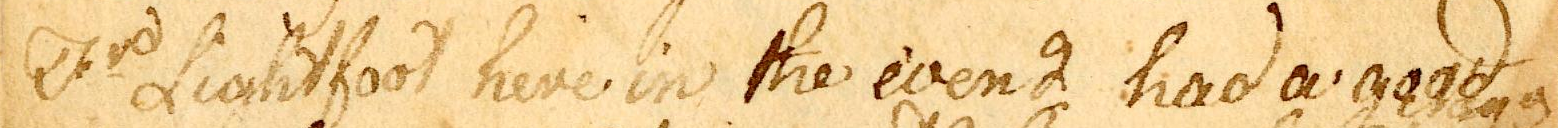F^rd Lightfoot here in the even^g had a good
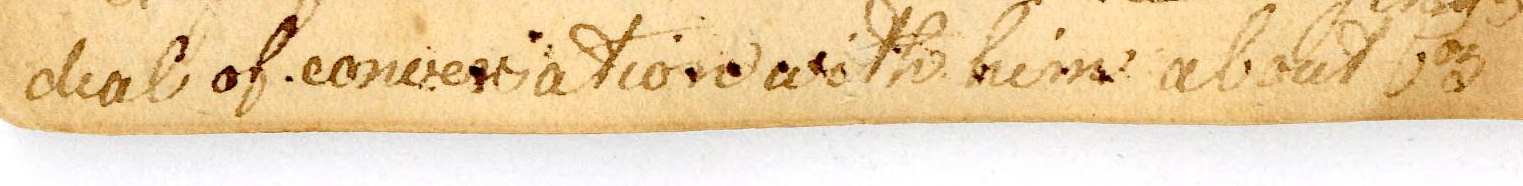deal of conversation with him about Coz
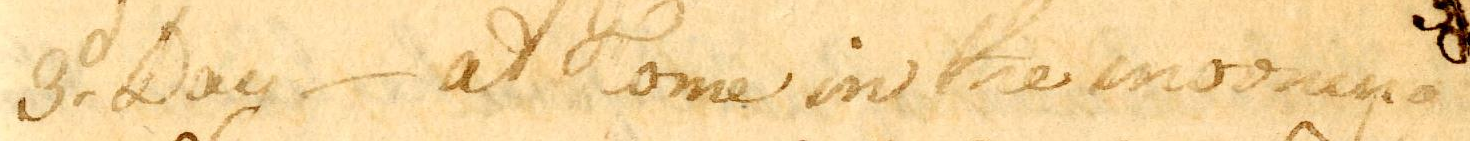3^d. Day- at Home in the morning
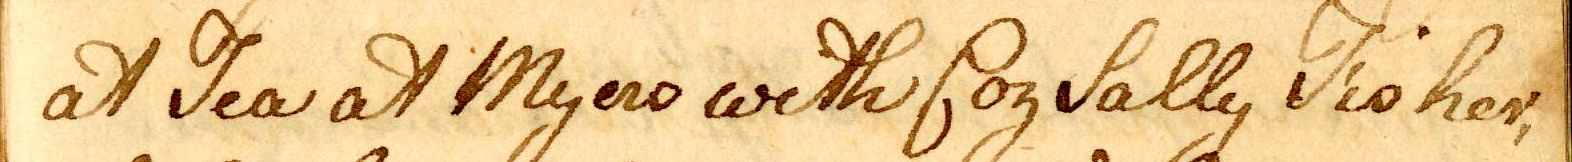at Tea at Myers with Coz Sally Fisher,
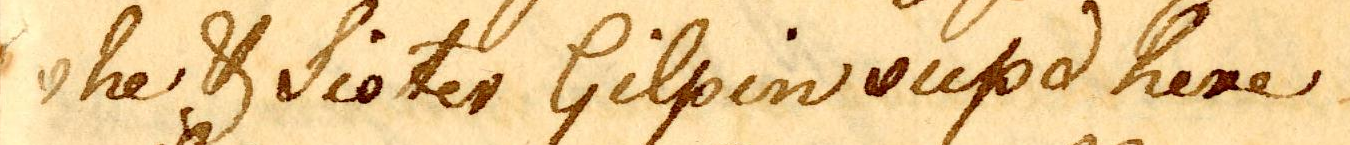she & Sister Gilpin supd here
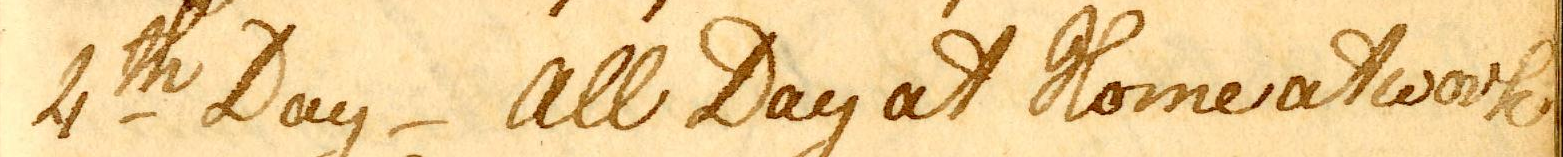4^th Day- All Day at Home at work
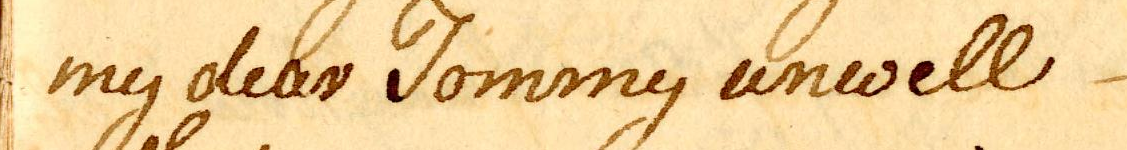my dear Tommy unwell
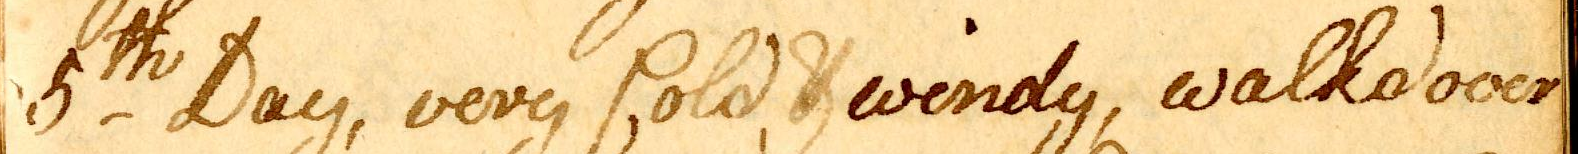5^th Day, very Cold & windy, walkd over
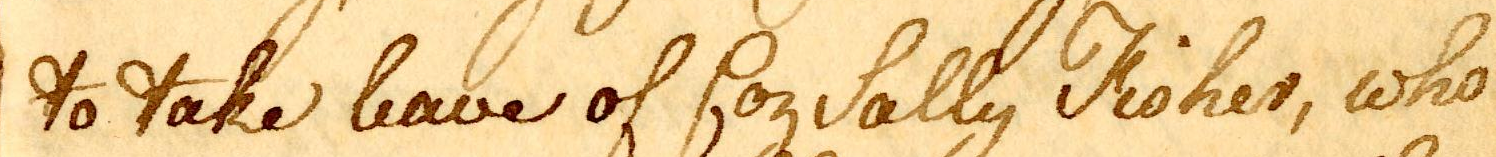to take leave of Coz Sally Fisher, who
